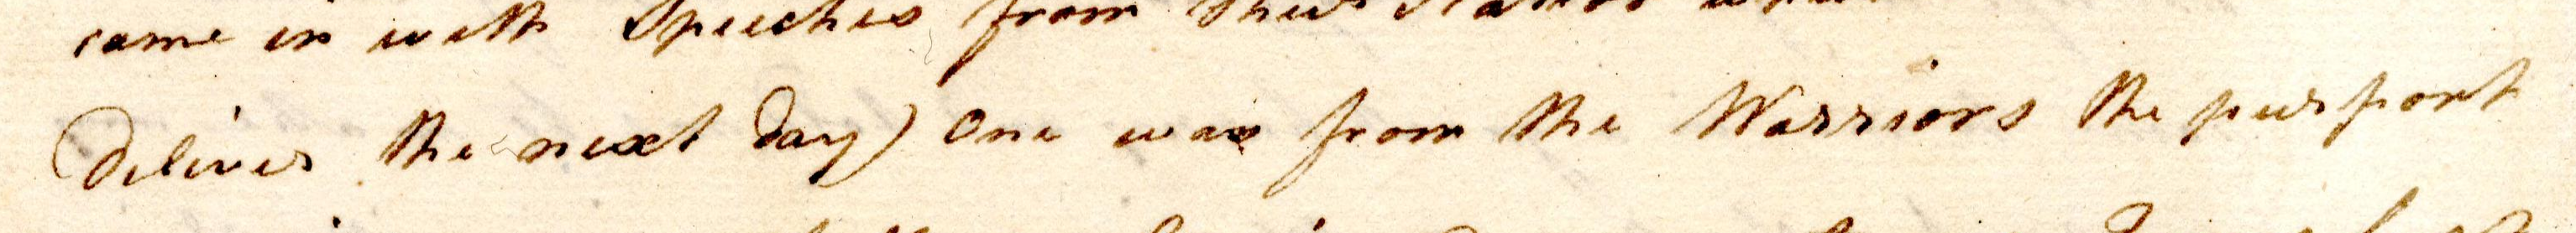deliver the next day, one was from the Warriors the purport
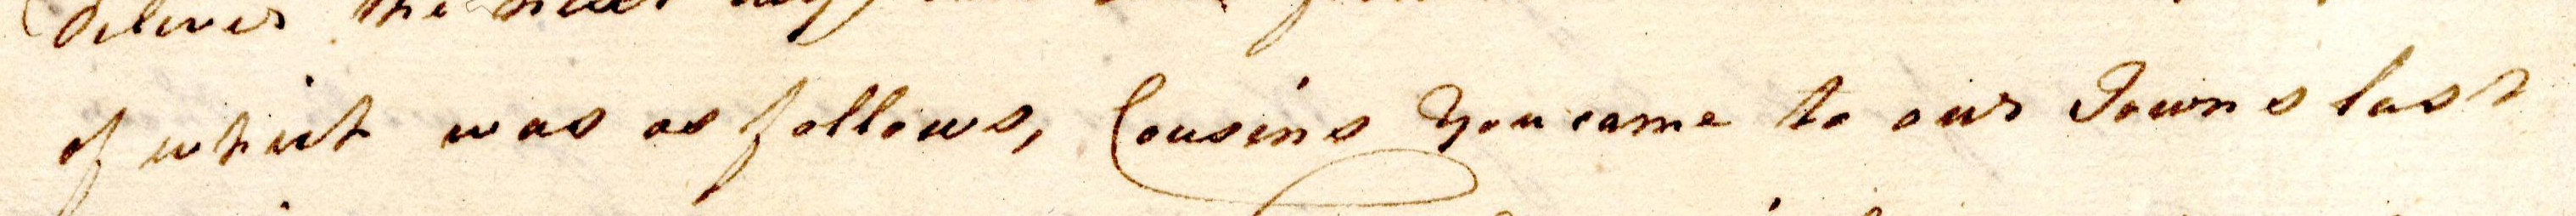of which was as follows, Cousins You came to our Towns last
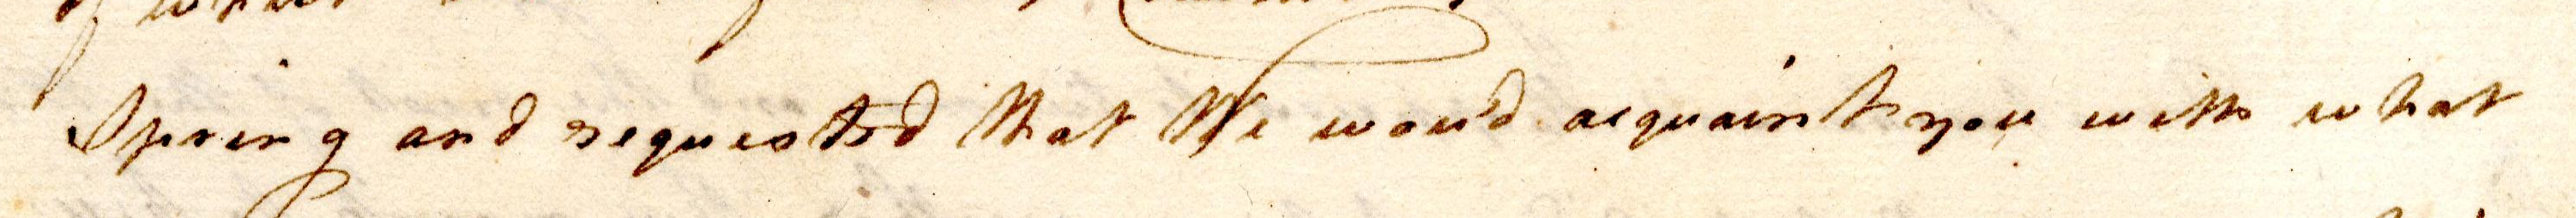Spring and requested that We wou'd acquaint you with what
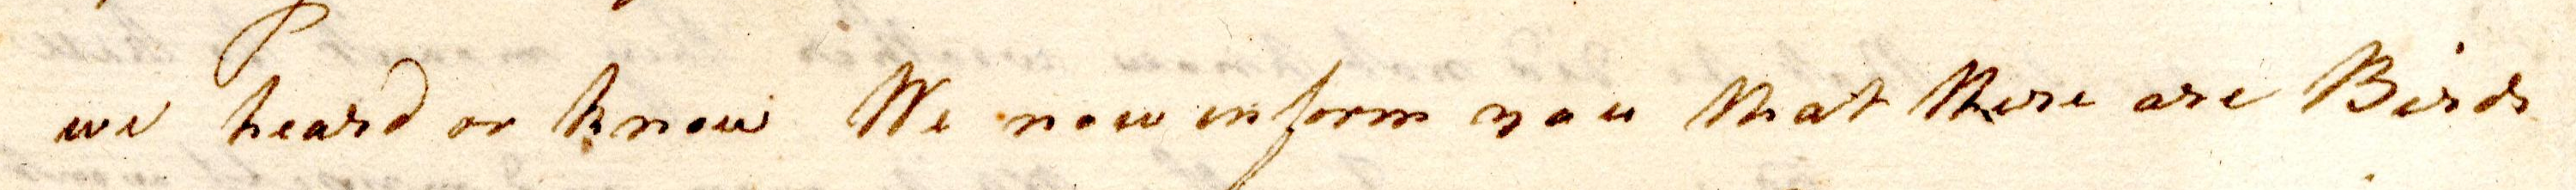we heard or know We now inform you that there are Birds
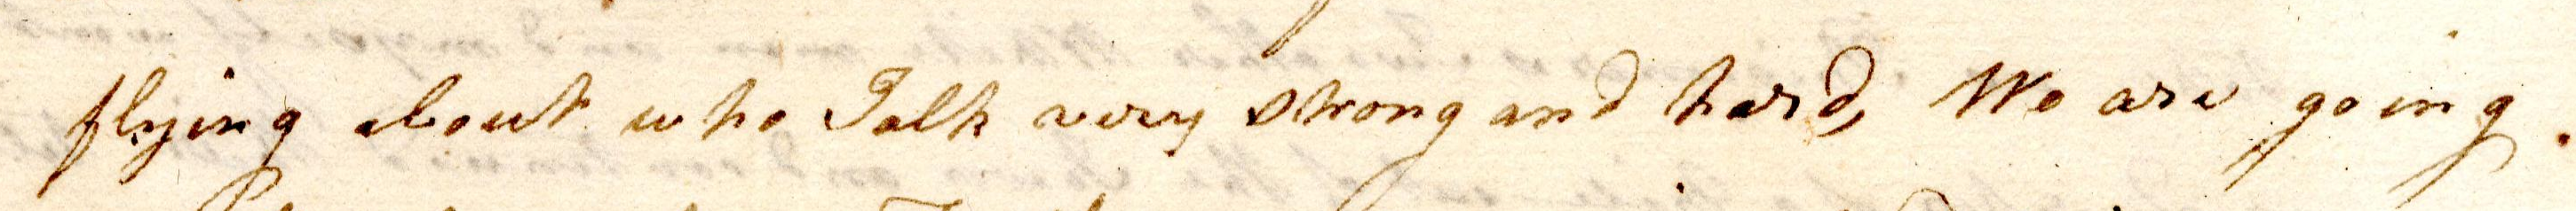flying about who Talk very strong and hard, We are going
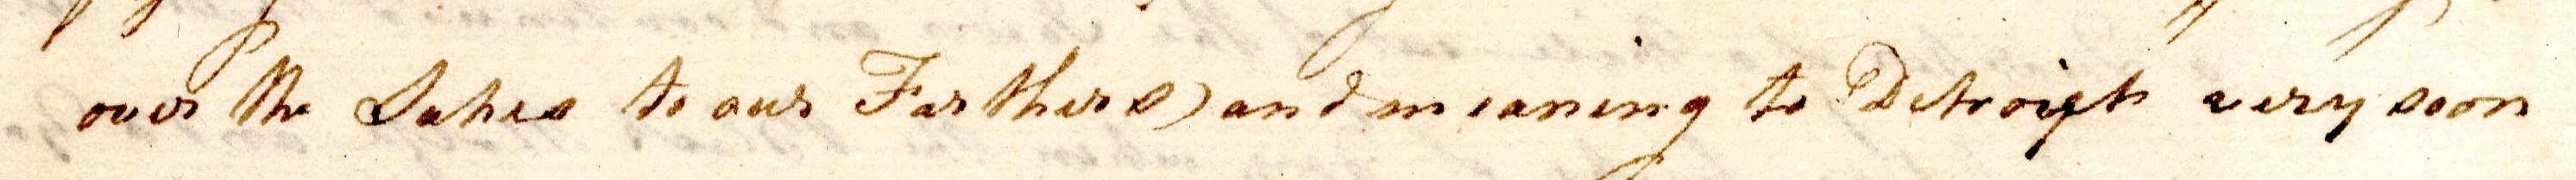over the Lakes to our Farthers, and meaning to Detroit very soon
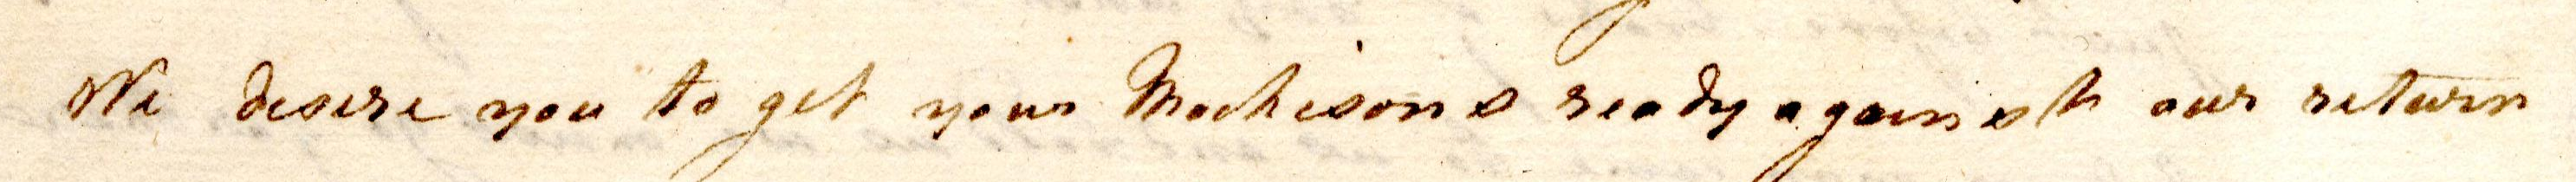We desire you to get your Mockisons ready against our return
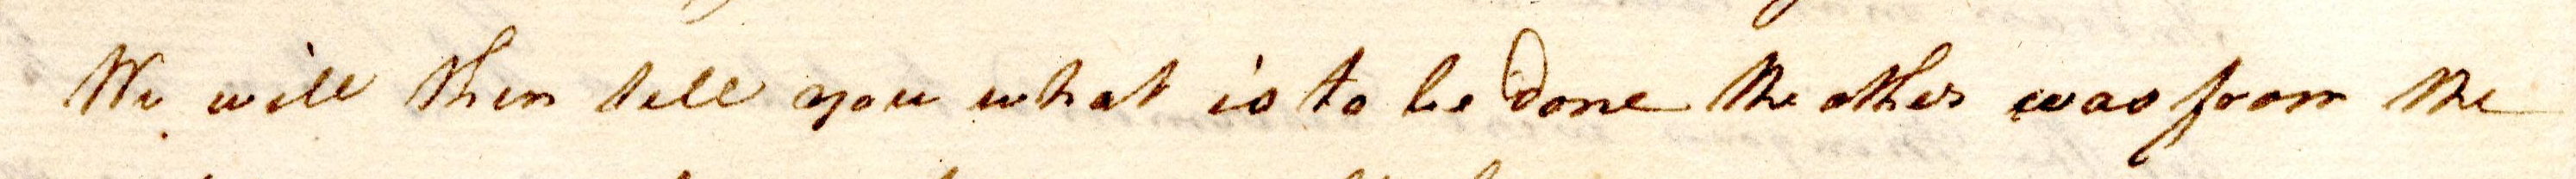We will then tell you what is to be done the other was from the
